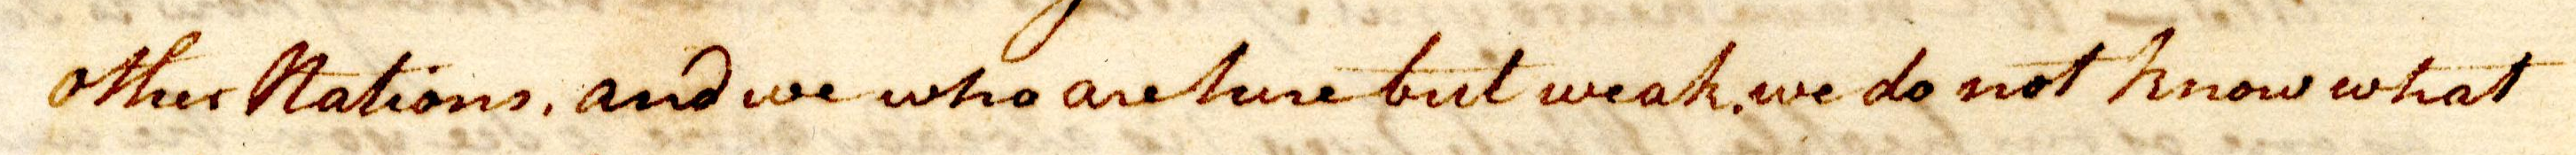Other Nations, and we who are here but weak, we do not know what
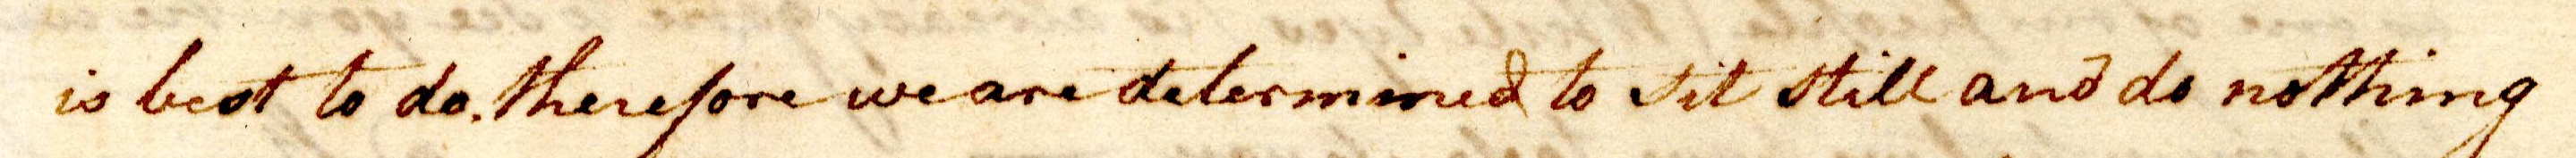is best to do, therefore we are determined to sit still and do nothing
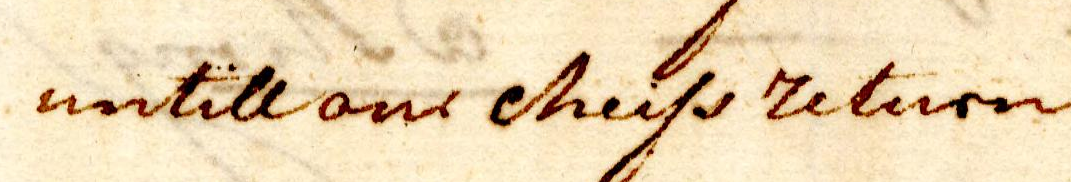untill our cheifs return
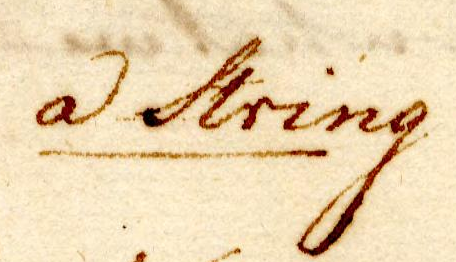- a String -
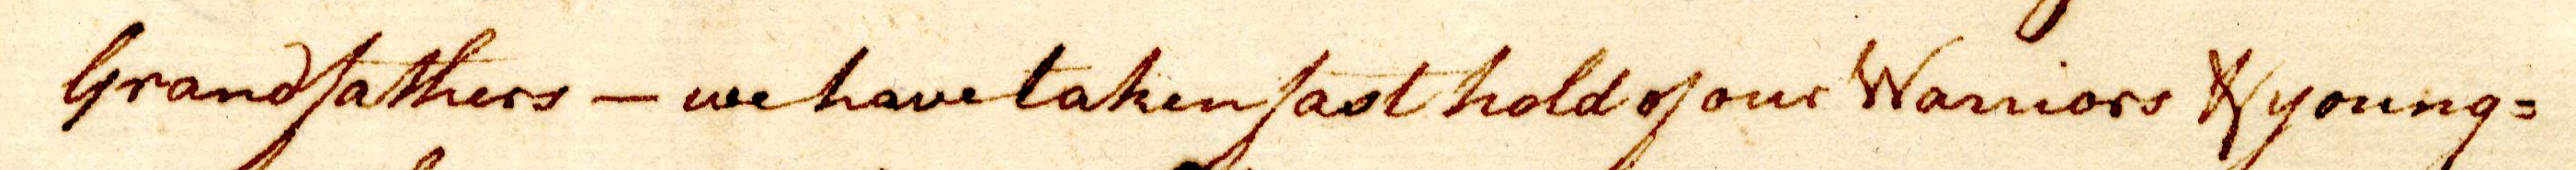Grandfathers - we have taken fast hold of our Warriors & young-
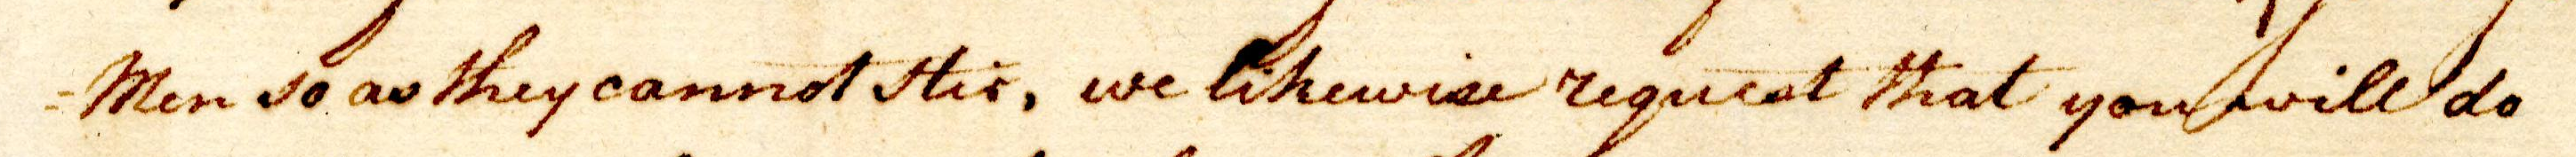-Men so as they cannot stir, we likewise request that you will do
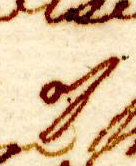of
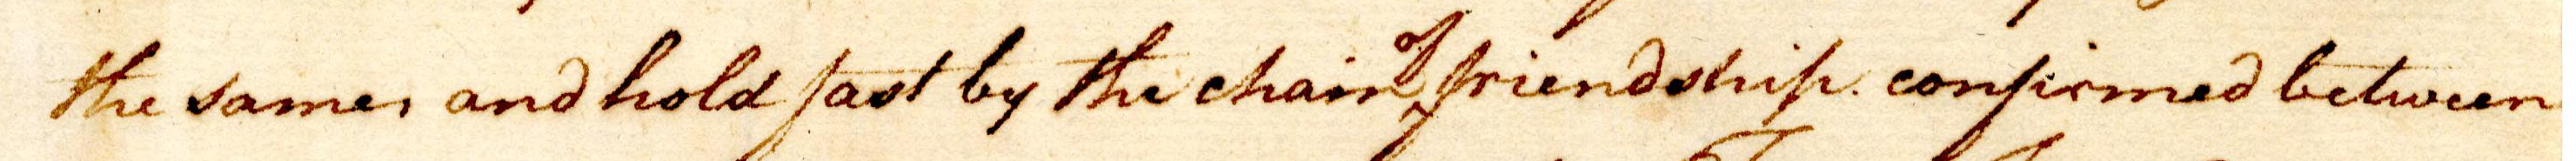the same, and hold fast by the chain ^ friendship confirmed between
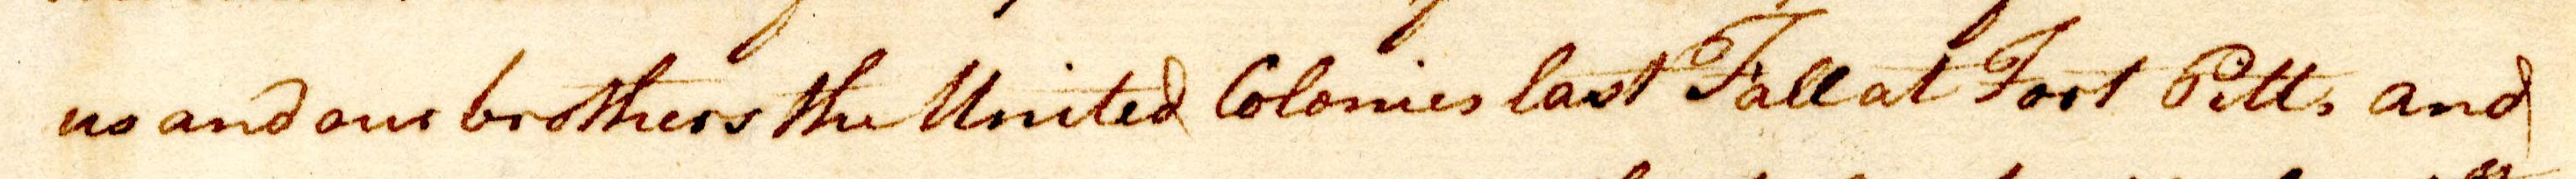us and our brothers the United Colonies last Fall at Fort Pitt, and
